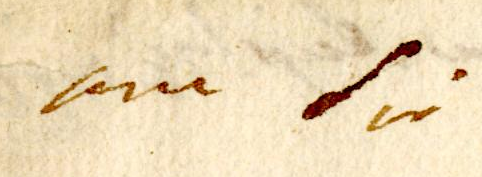am Sir
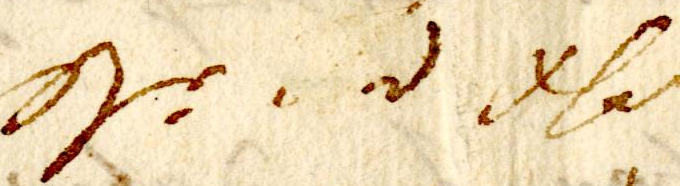Y^r S^t &C
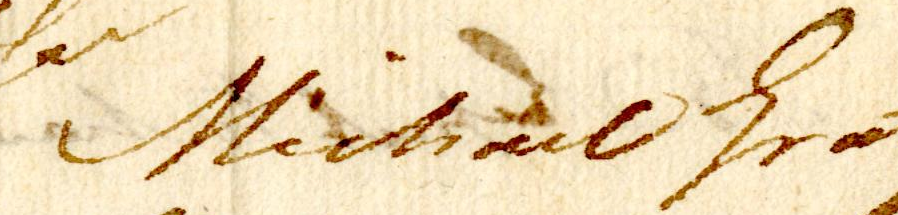Michael Gratz
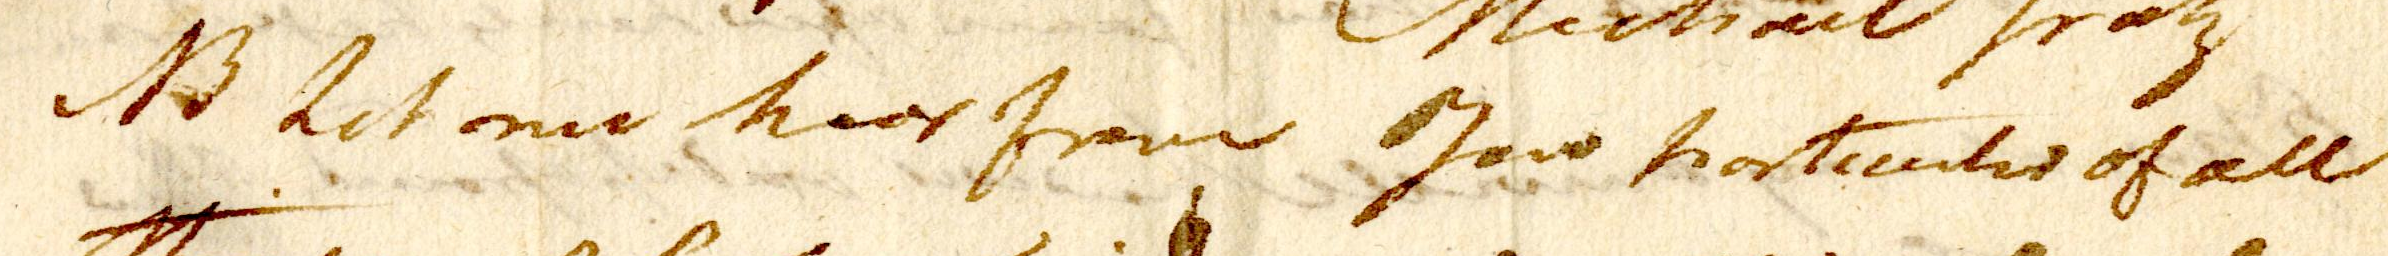NB let me hear from you portends of all
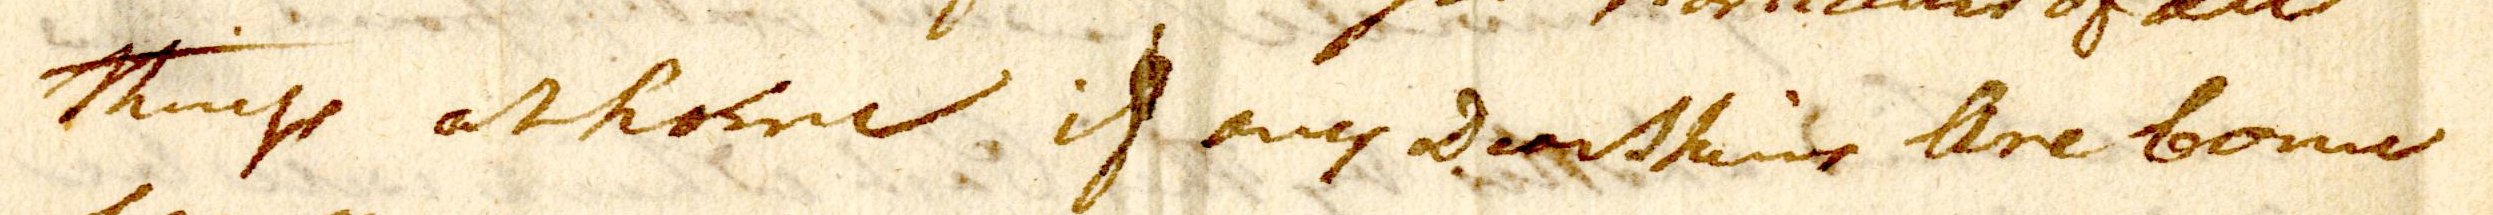theyr at home if any Dear Skins Are come
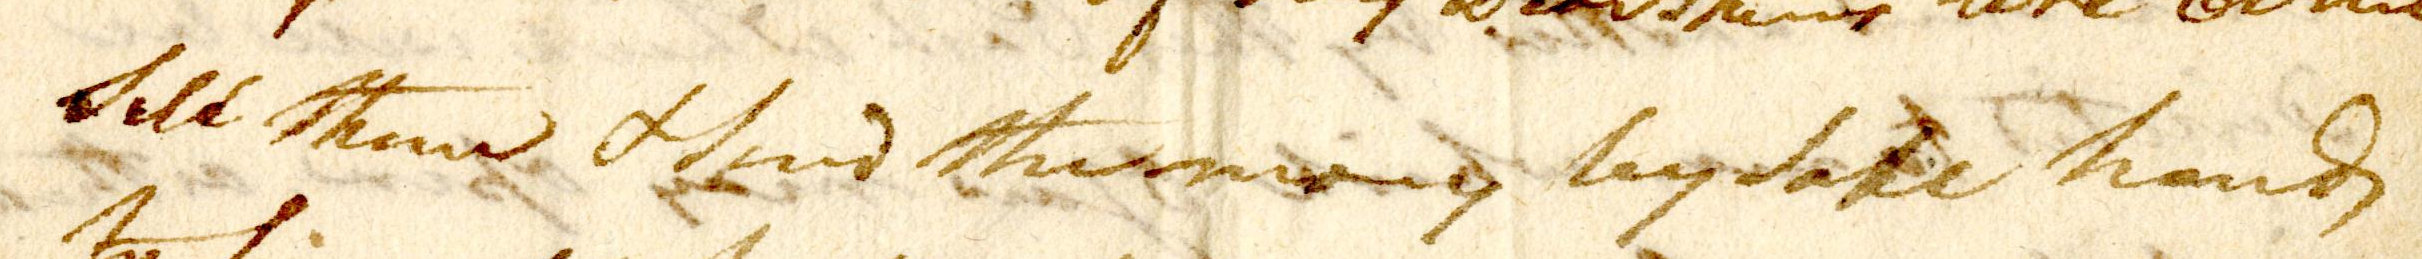sell them & send the money by safe hand
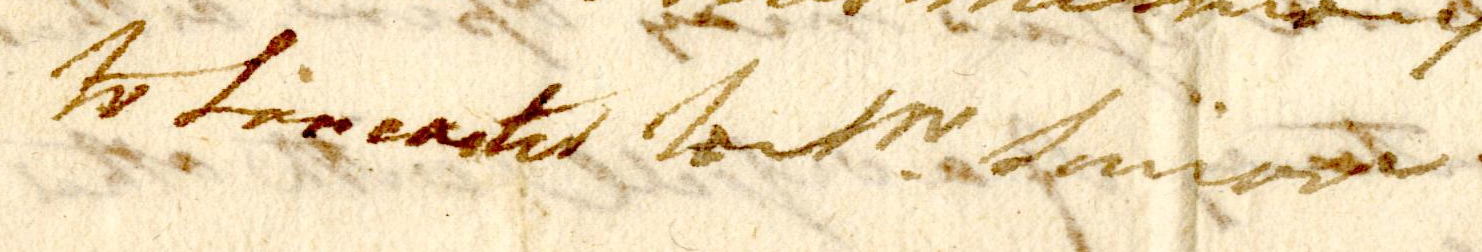to Lancaster to M^r Simon
